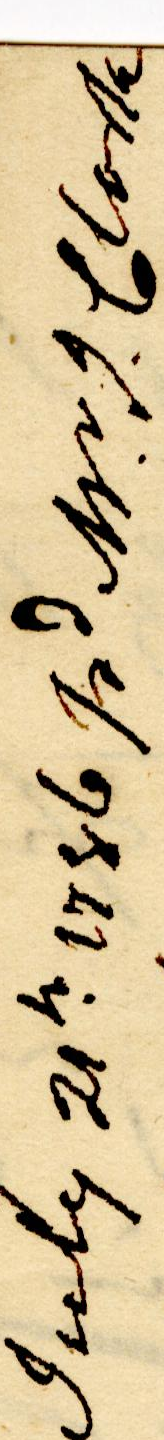July 21^th 1786 p^d M^r J Clarke
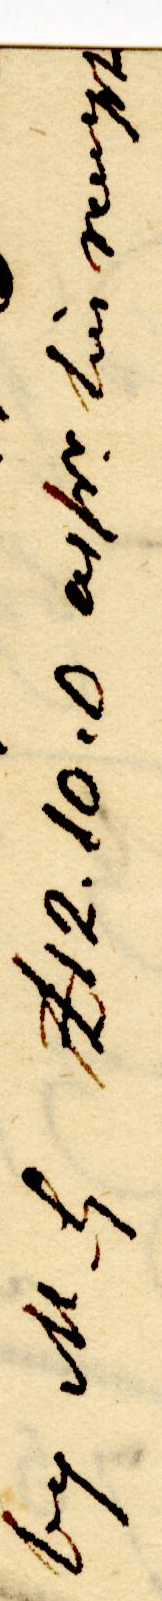by M. G £12.10.0 as per his receipt
